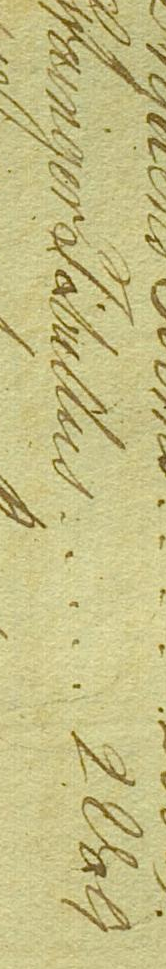Grainger Tibullus . . . . . 2 Vols
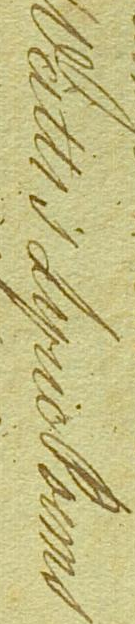Watts's Lyric Poems
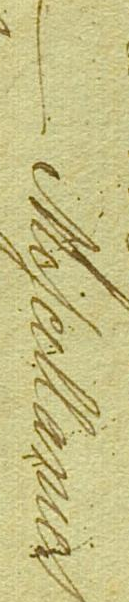–––– Miscellanies
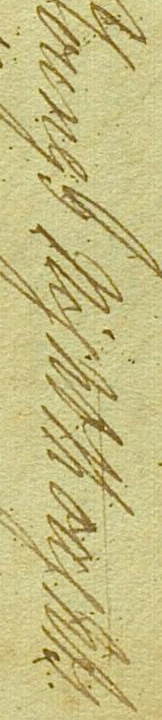Young's Night thoughts
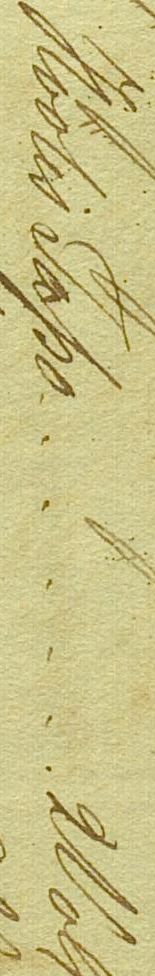Hooles Tasso . . . . . . 2 Vols
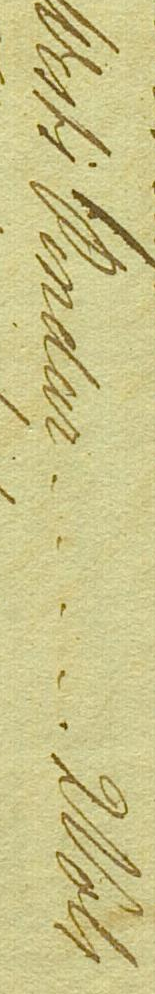West's Pindar . . . . . 2 Vols
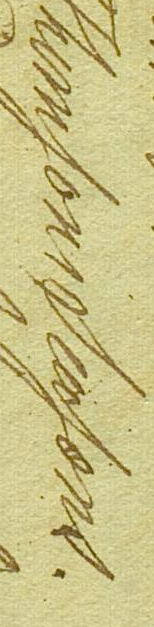Thomsons Seasons.
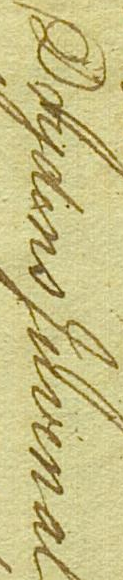Drydens Juvenal.
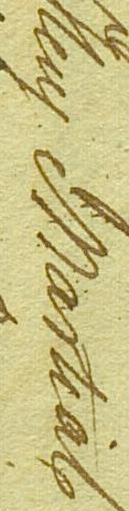Vey Martial.
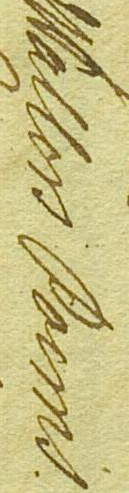Wallons Poems.
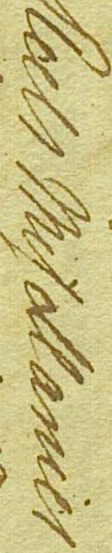Noels Miscellanies
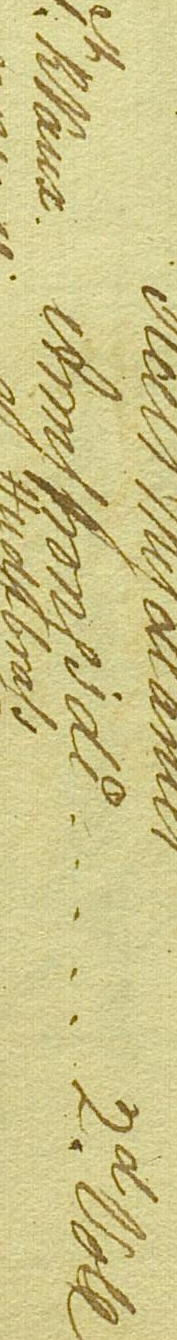T^h. R Vaux. Armstrong's di^o . . . 2^d. Vols.
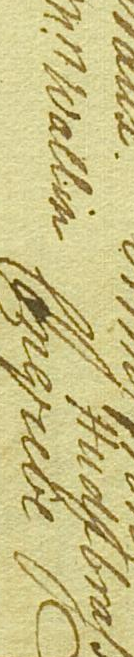M^r Wallin Hudebrass Congreve
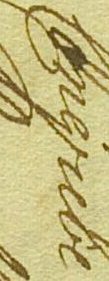Congreve
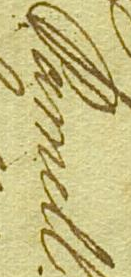Parnell.
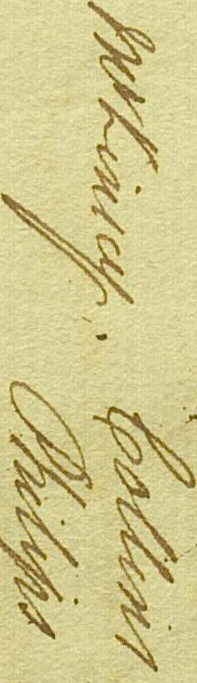M^r Linsey. Collins
